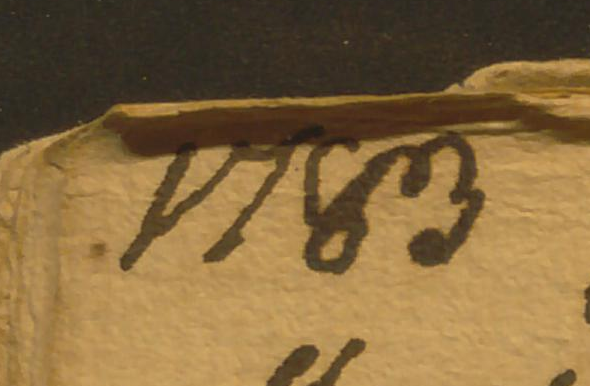1783
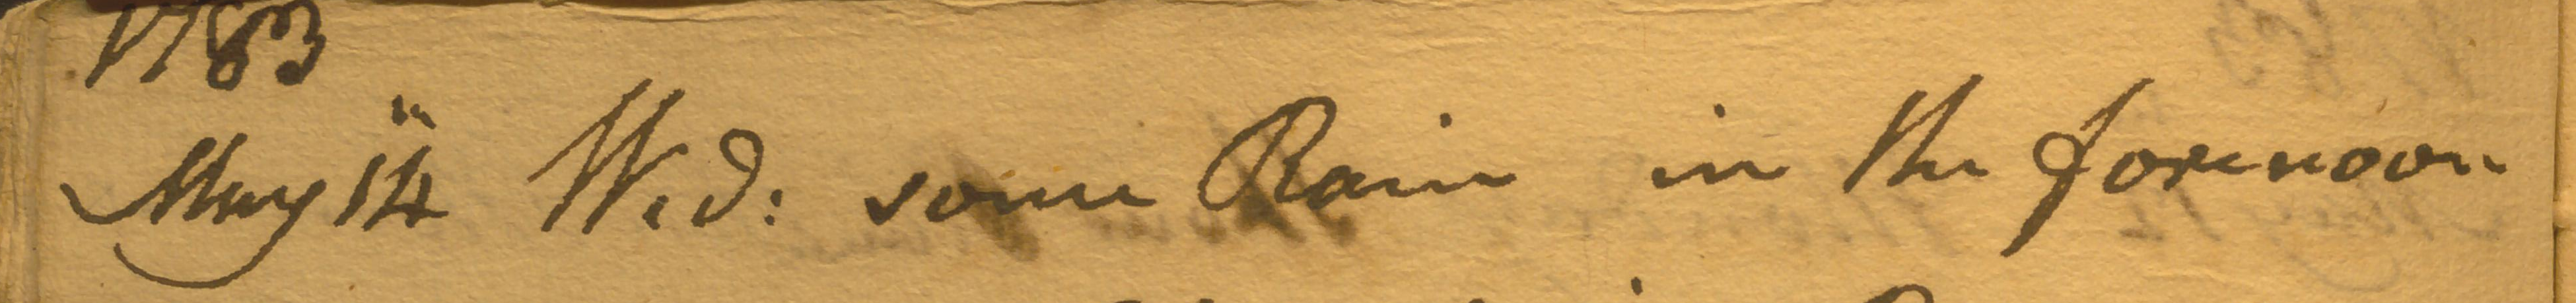May 14^th Wed: some Rain in the forenoon
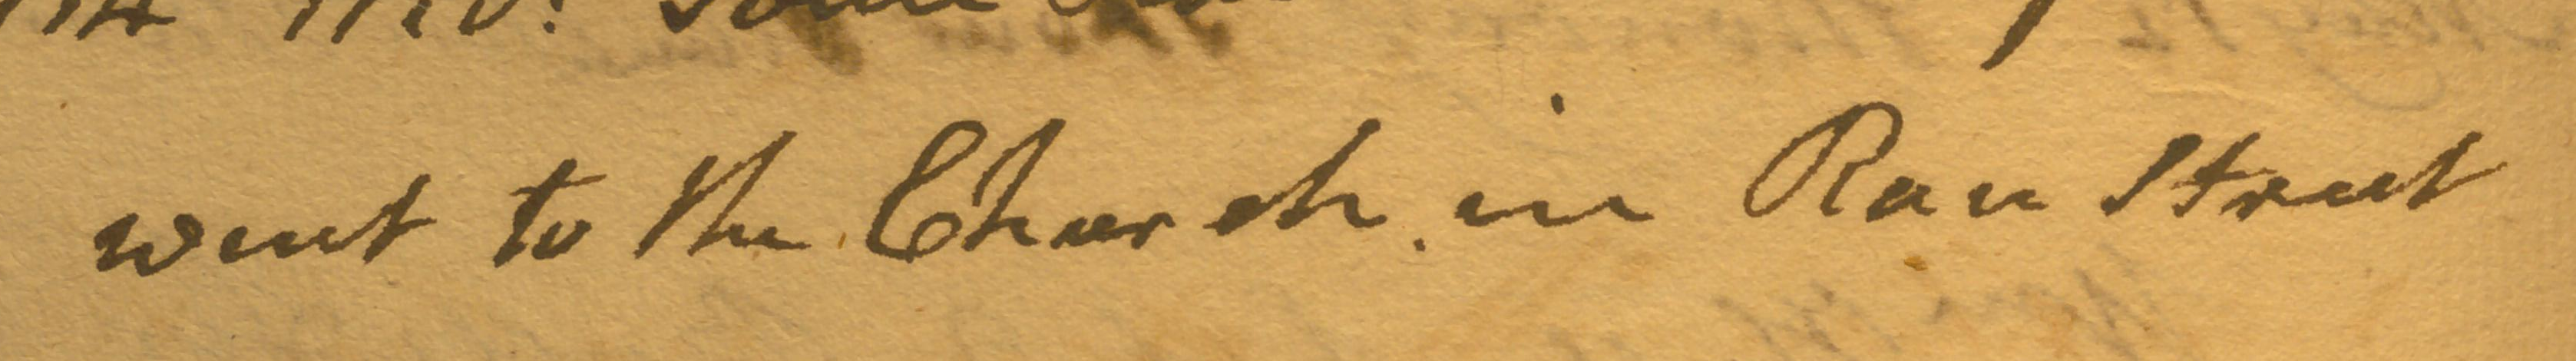went to the Church in Race Street
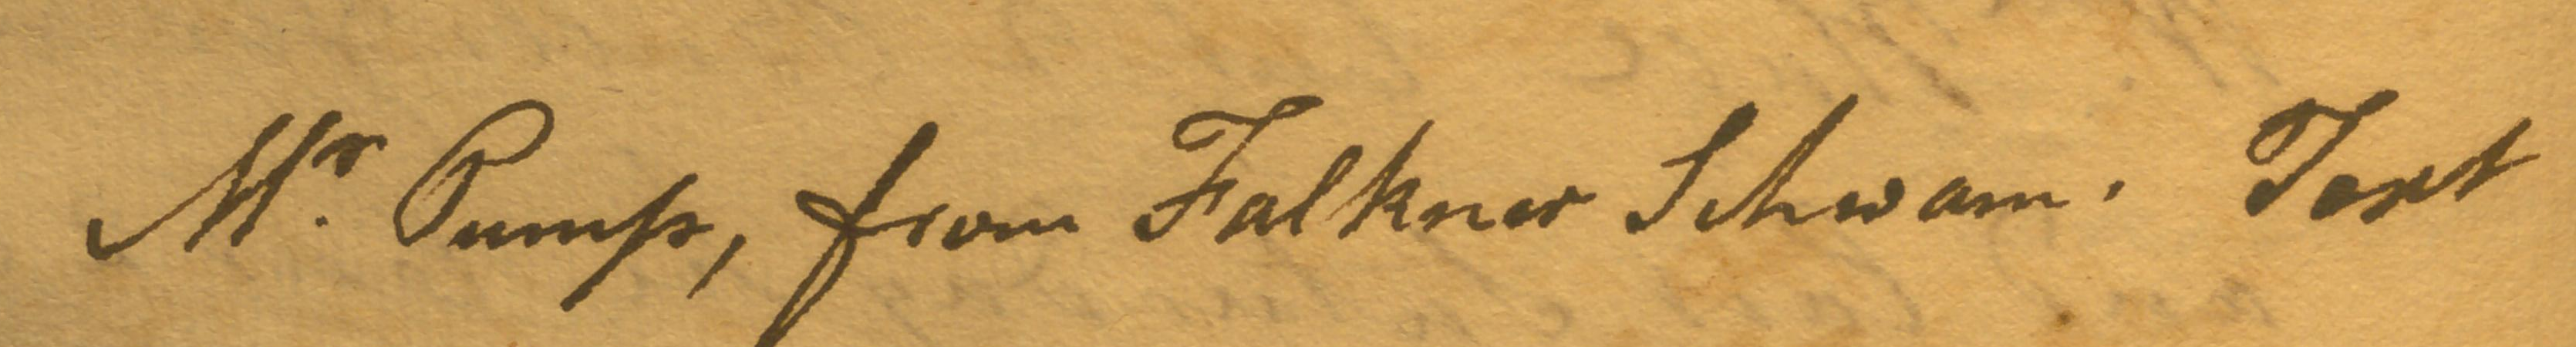M^r. Pump, from Falkner Schwam. Text
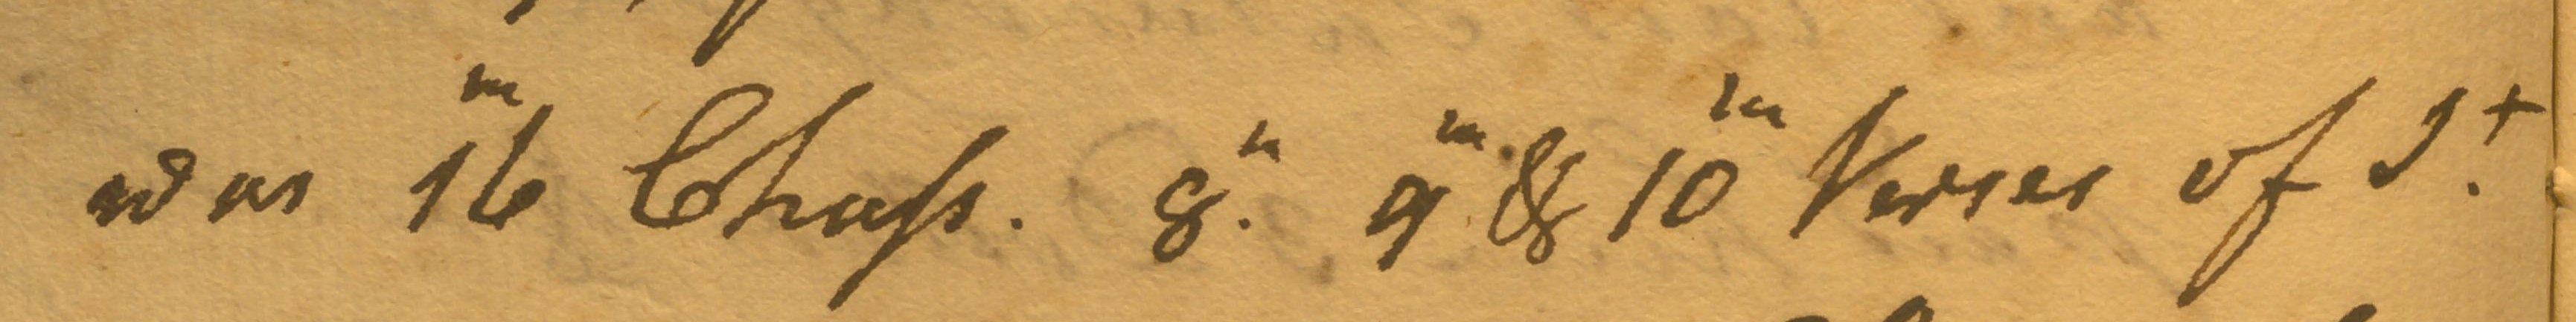was 16^th Chap. 8^th. 8^th & 10 Verses of S^t.
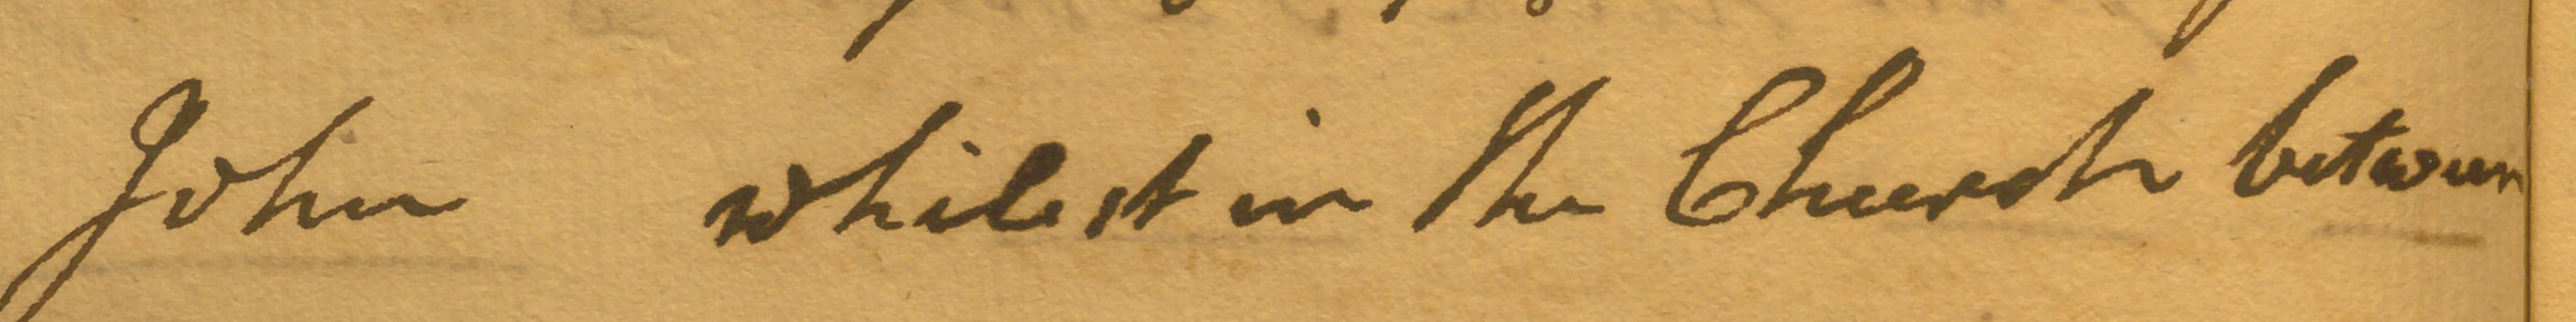John whilest in the Church between
